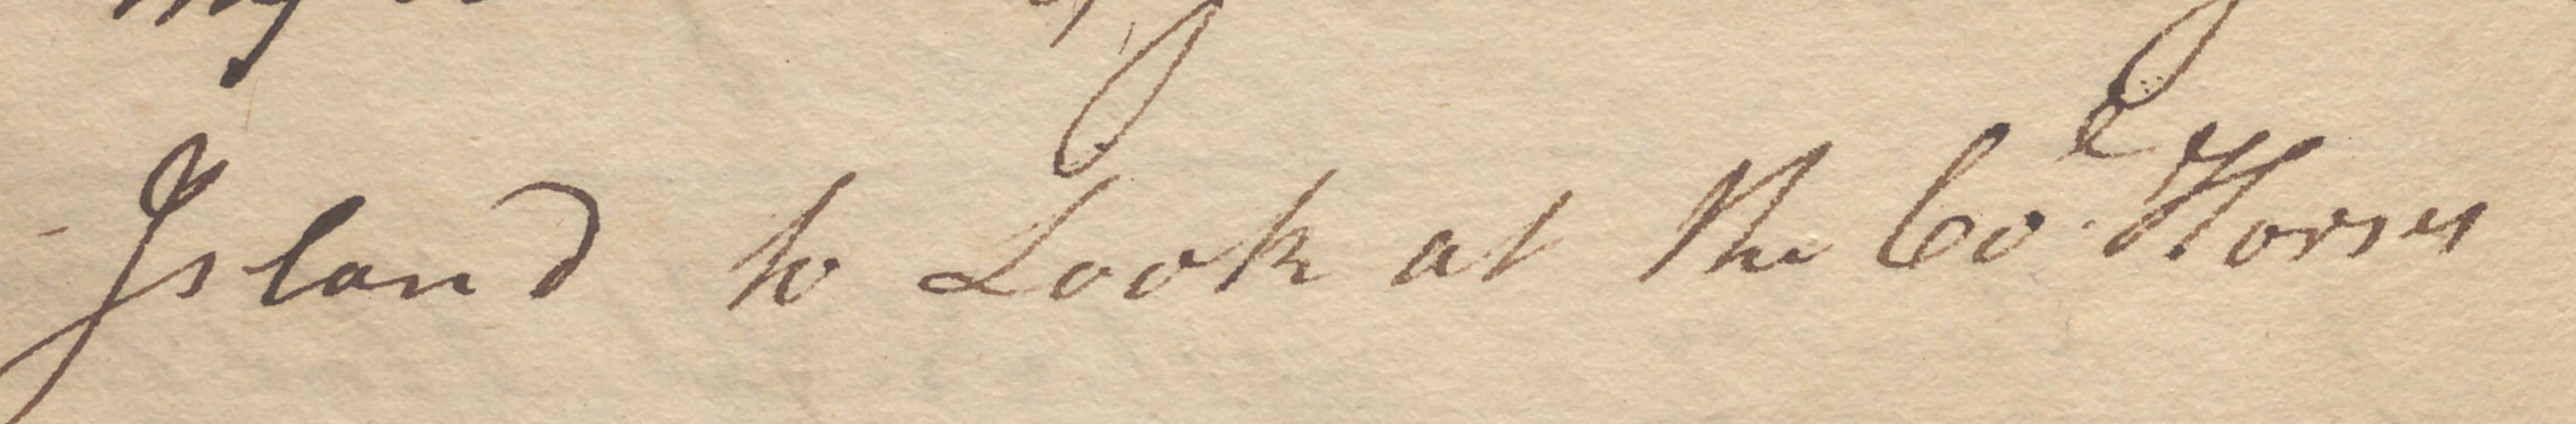Island to Look at the Co^l. Horses
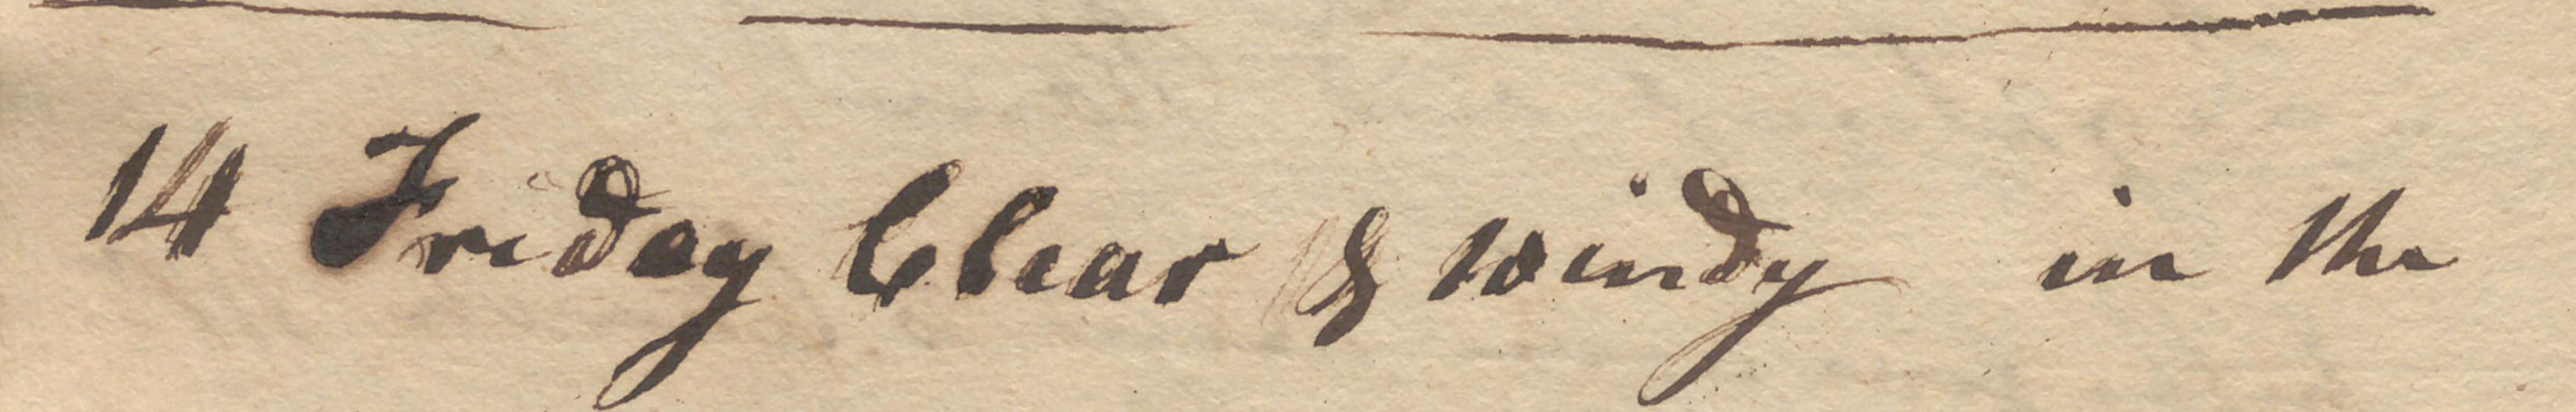14 Friday Clear & Windy in the
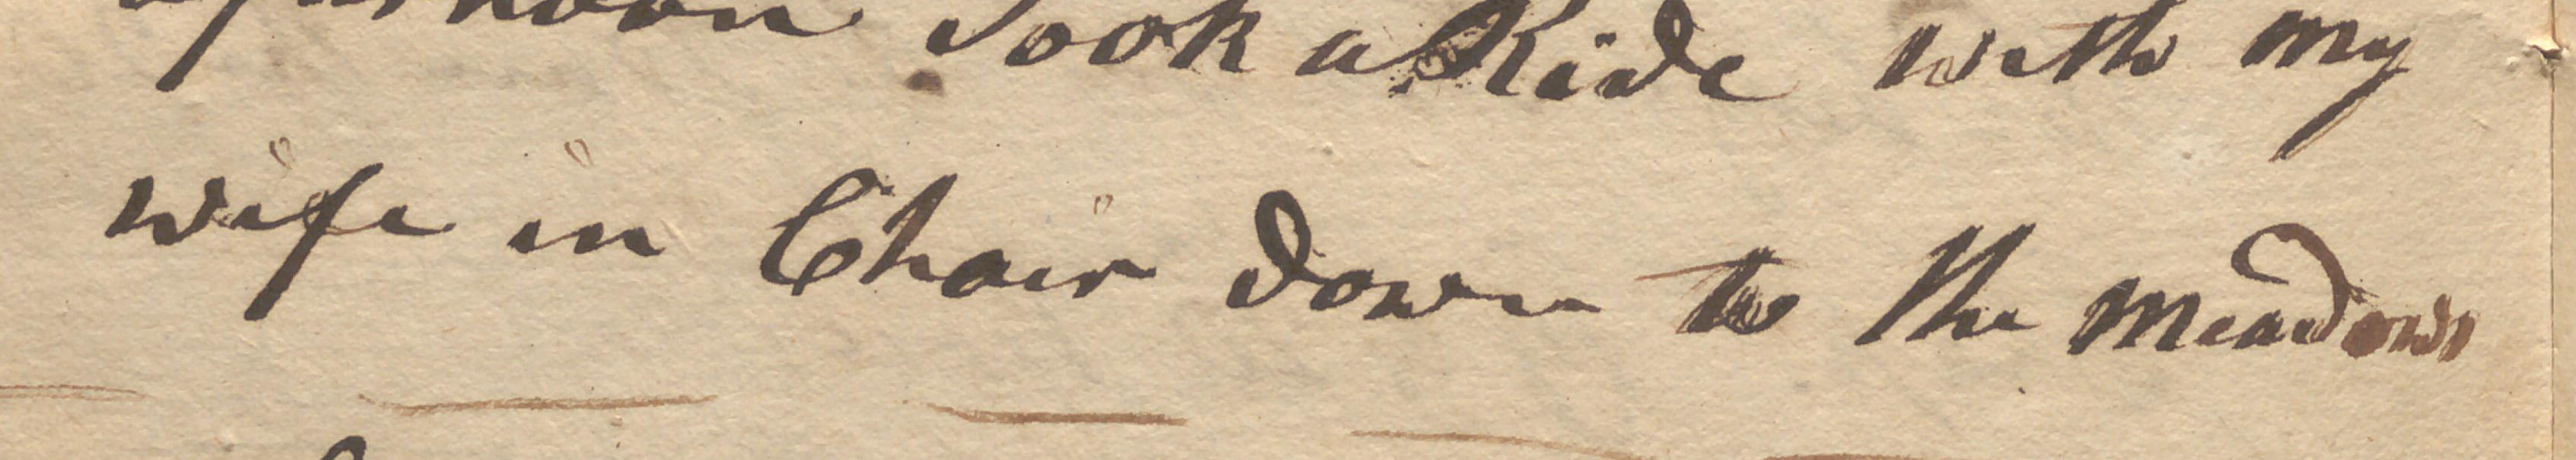wife in Chair down to the meadows
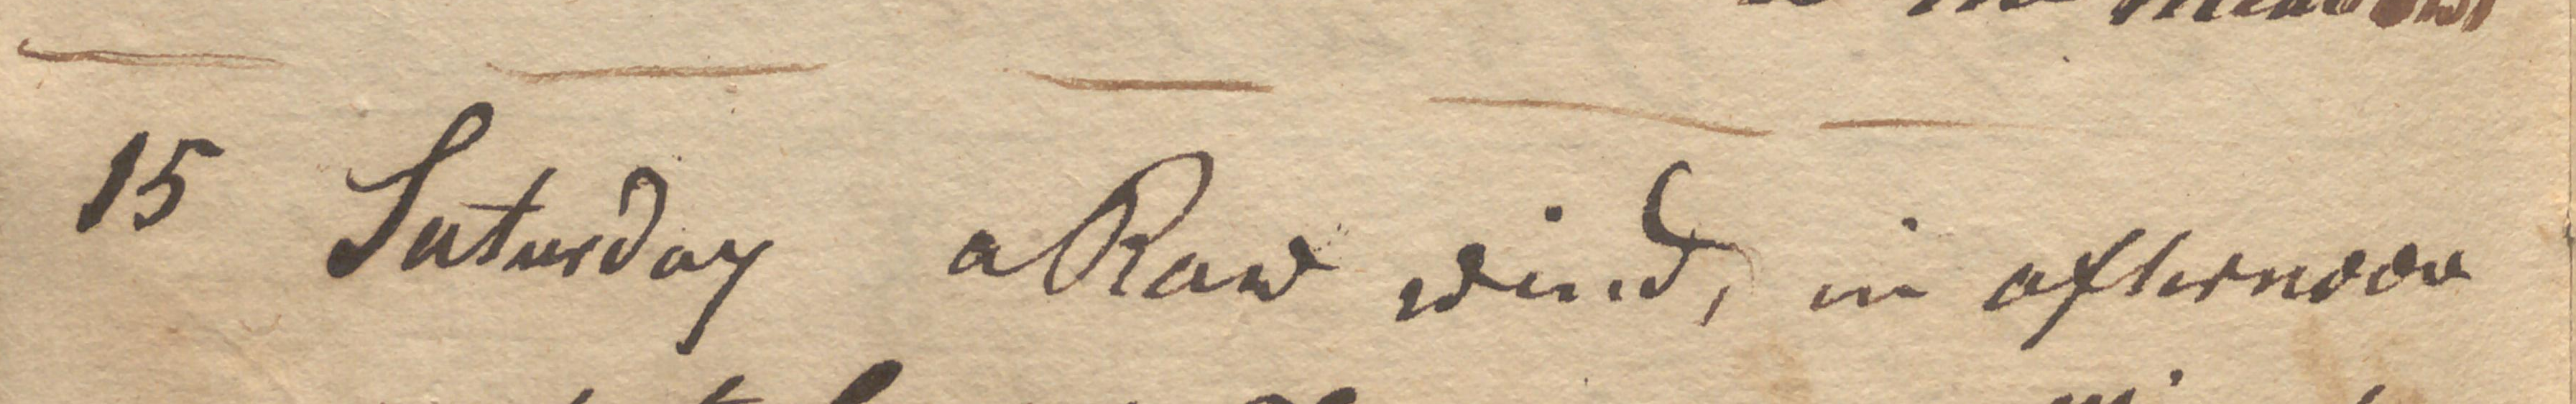15 Saturday a Raw wind, in afternoon
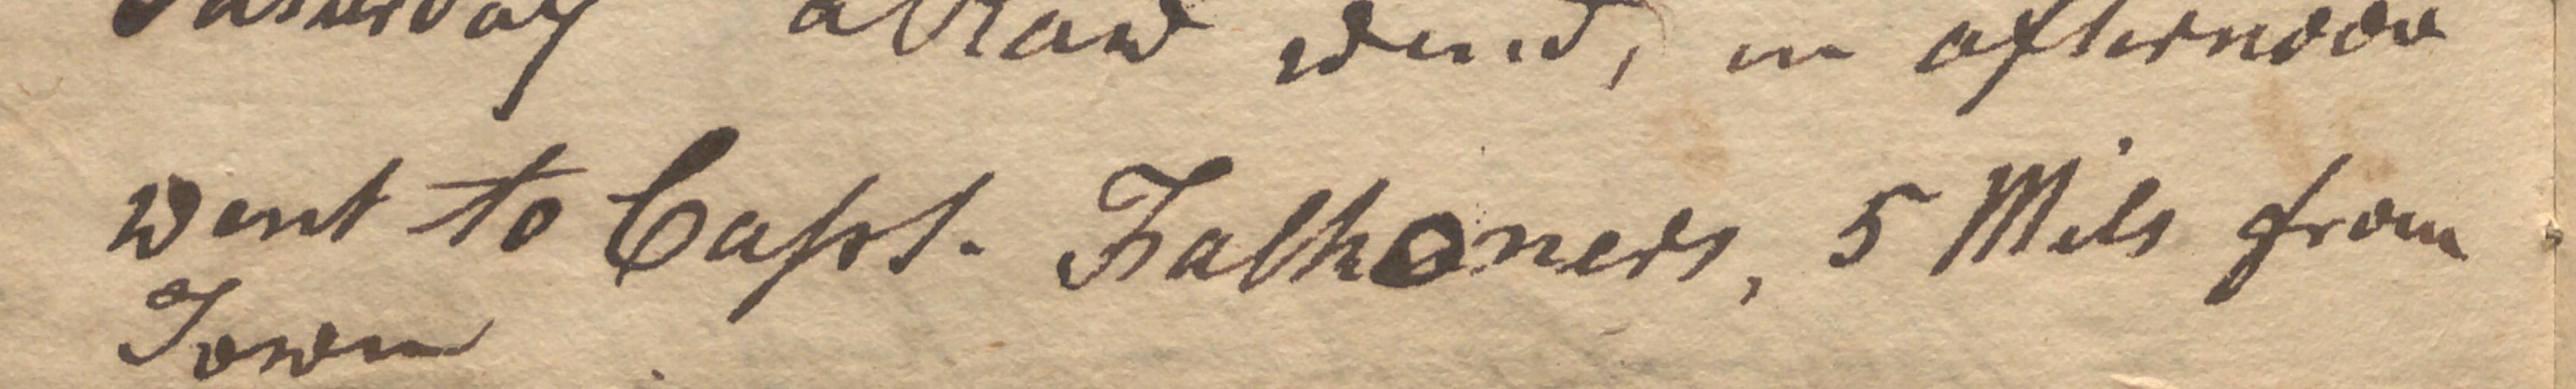went to Capt. Falkoners 5 Mils from
